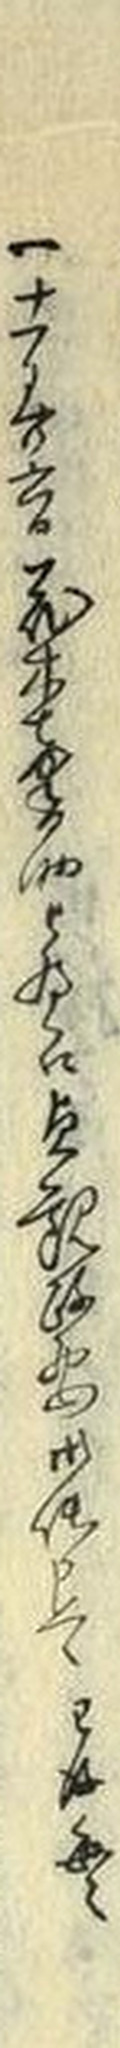一十一月廿六日花木馨助被為召貞観政要御咄申上候已後毎々
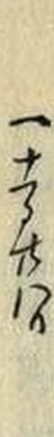一十一月廿九日
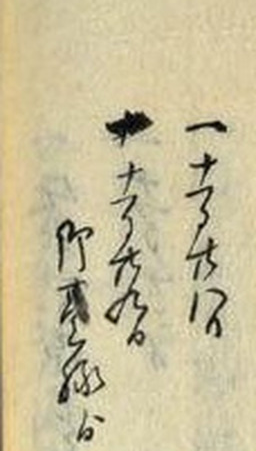一十一月廿九日
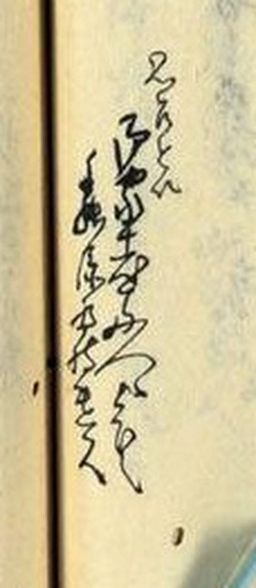御家老両人へ被下之
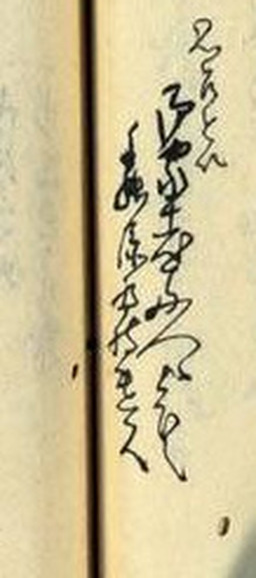手紙添為持遣ス
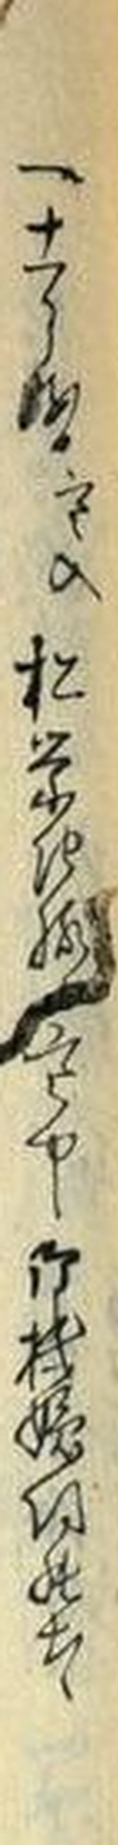一十一月晦日寒入松栄院様寒中御機嫌伺罷出候
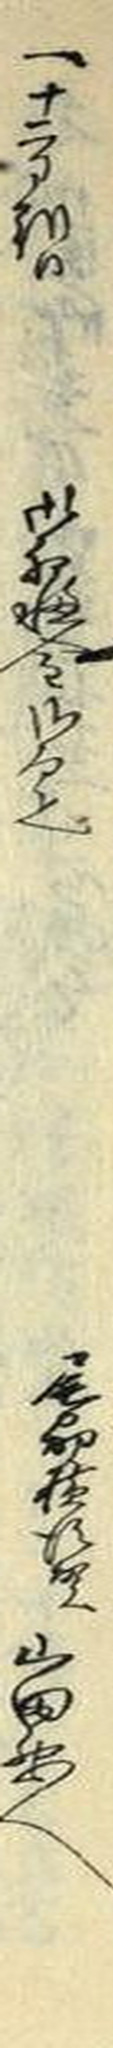一十二月朔日御初穂金弐百疋尾州横須賀山田要人
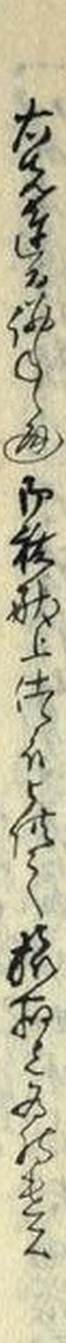右先達而例年之通御祓献上仕候ニ付被供之旅宿迄為持遣ス
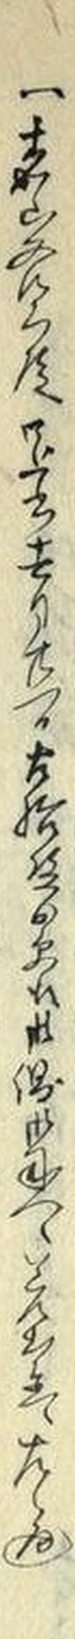一森山又左衛門殿口上書去月廿一日左膳殿ゟ受取御側御用人へ差出置候左之通
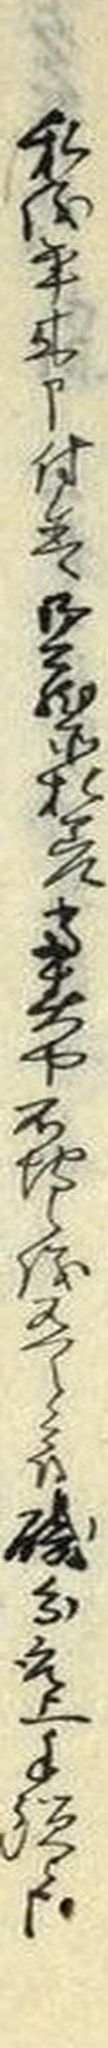私儀年来申付置候御蔵所札差当春中不埒之儀有之候ニ付職分取上手鎖被申
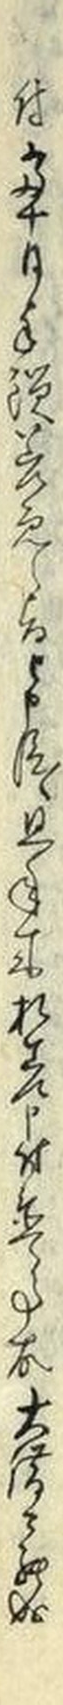付当十月手鎖差免候旨被申渡候且年来札差申付置候事故大借ニ罷成
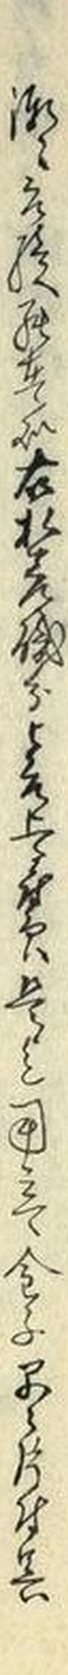漸々取続罷在候処右札差職分被取上候ニ付而ハ是迄用立候金子早々片付呉
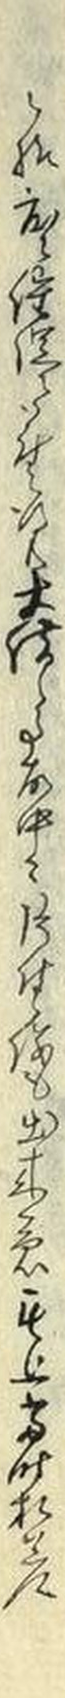候様度々催促ニ御座候得共大借之事故中々片付候儀も出来兼其上当時札差
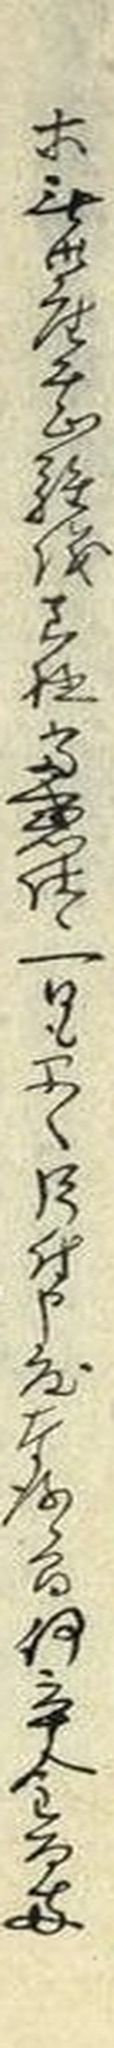等無御座甚難儀至極当惑仕候一日も早く片付申度奉存候間何卒金百両
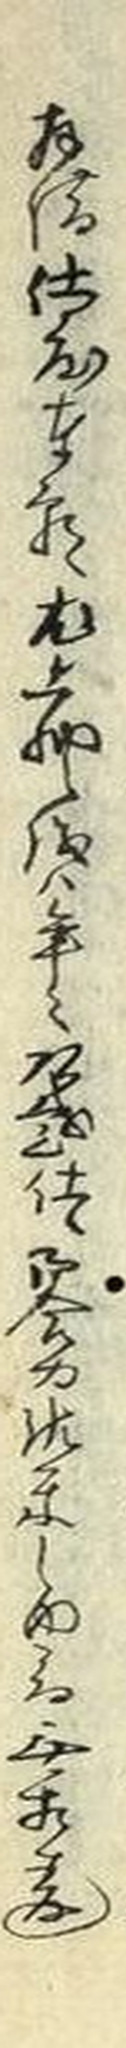拝借仕度奉願候尤上納之儀ハ年々頂戴仕候御合力銀米之内ニ而無相違
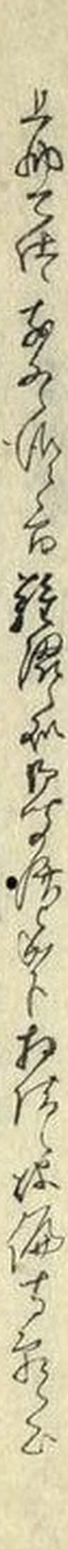上納可仕候前文之趣ニ候間難渋之処御聞済被成下拝借之儀偏奉願候已上
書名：少傅日録抄（斉善付側向頭取日記、在府）
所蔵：福井県文書館 Fukui Prefectural Archives
